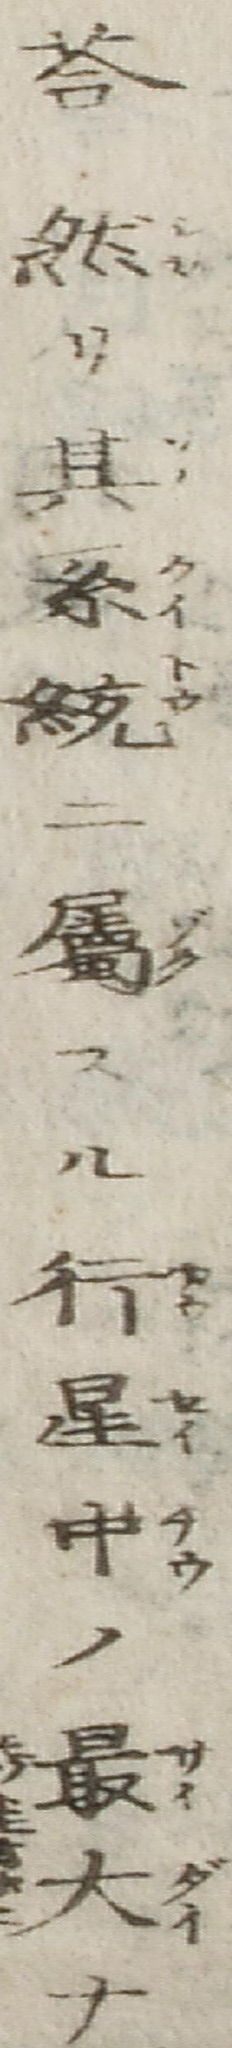答然リ其系統ニ属スル行星中ノ最大ナ
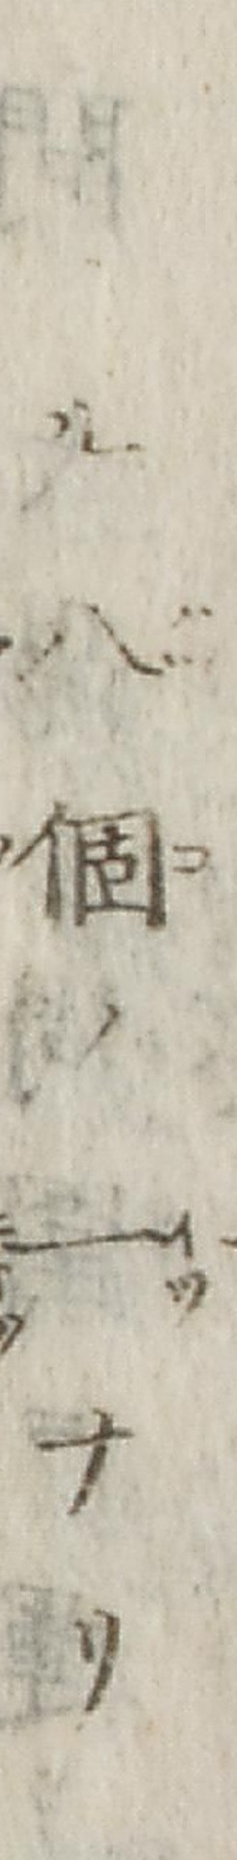ル八個ノ一ナリ
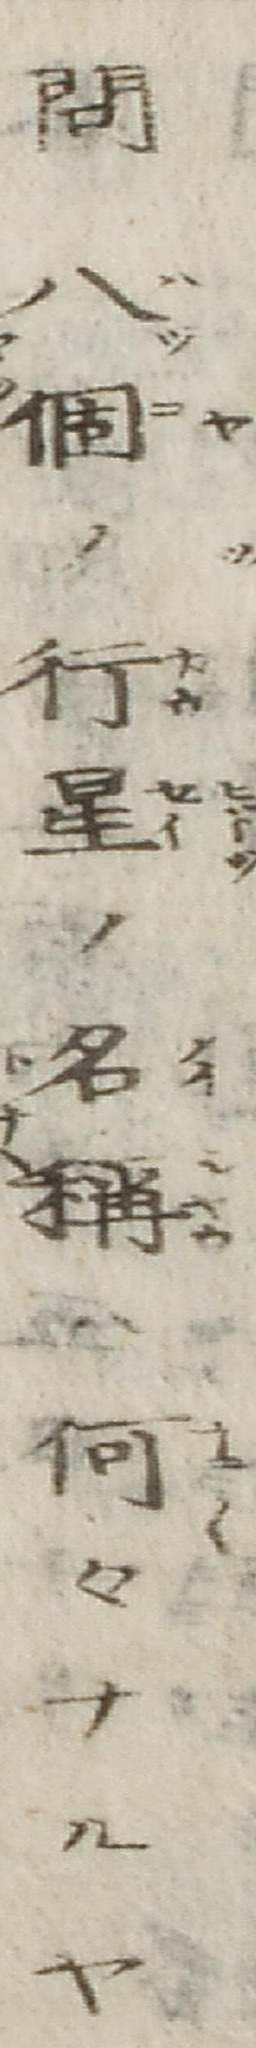問八個ノ行星ノ名称ハ何々ナルヤ
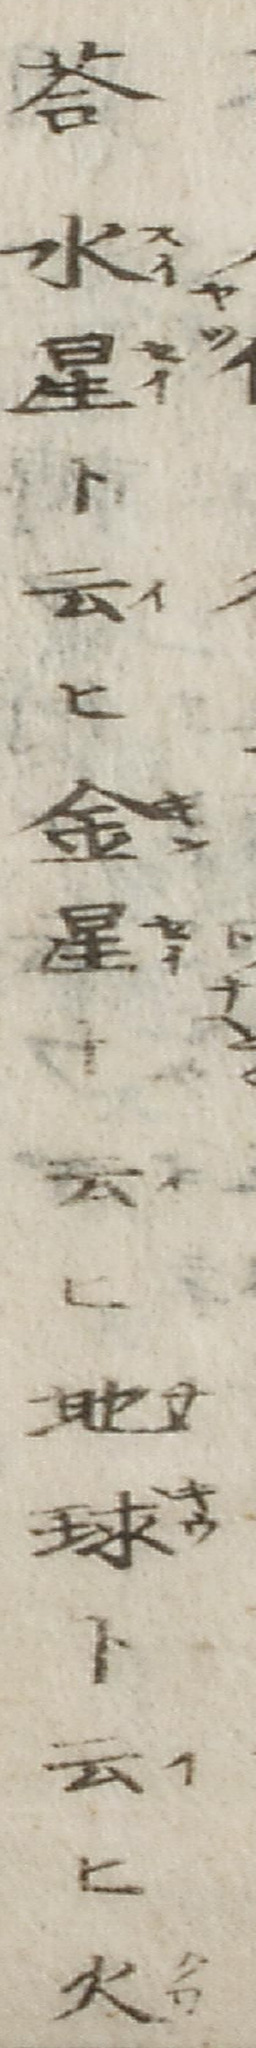答水星ト云ヒ金星ト云ヒ地球ト云ヒ火
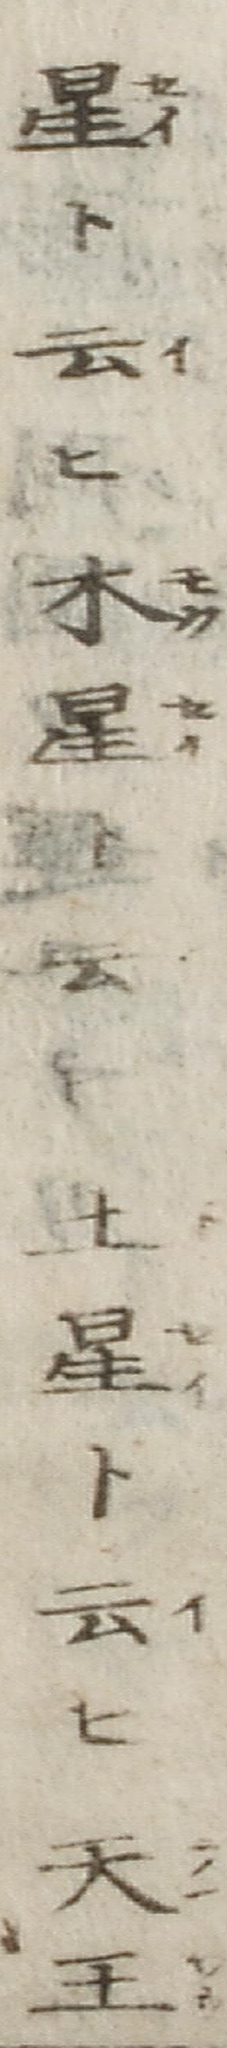星ト云ヒ木星ト云ヒ土星ト云ヒ天王
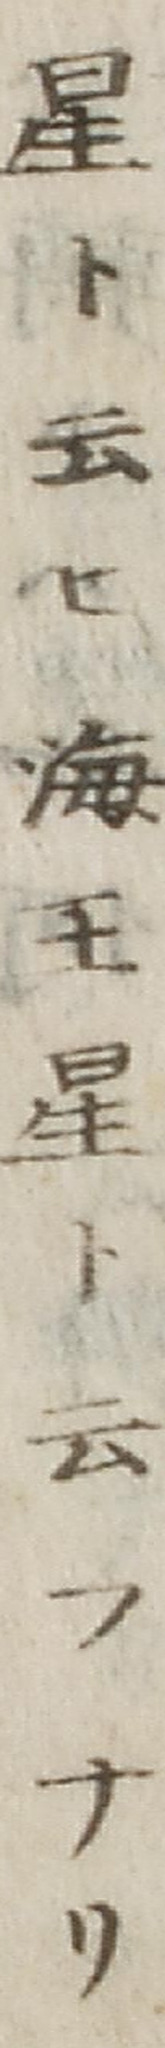星ト云ヒ海王星ト云フナリ
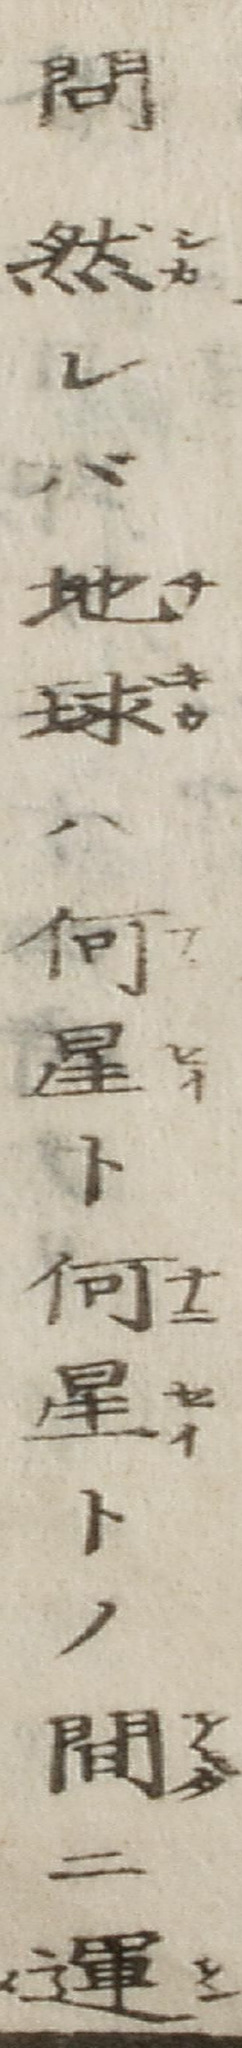問然レハ地球ハ何星ト何星トノ間ニ運
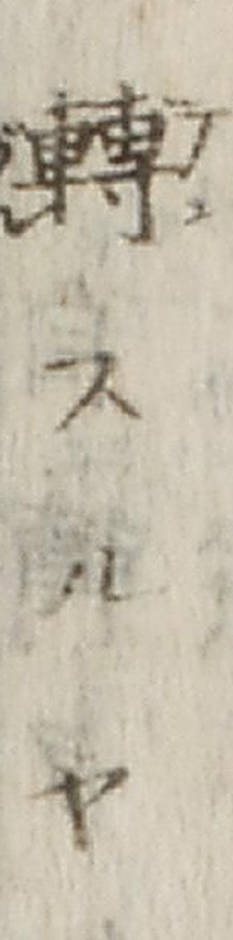転スルヤ
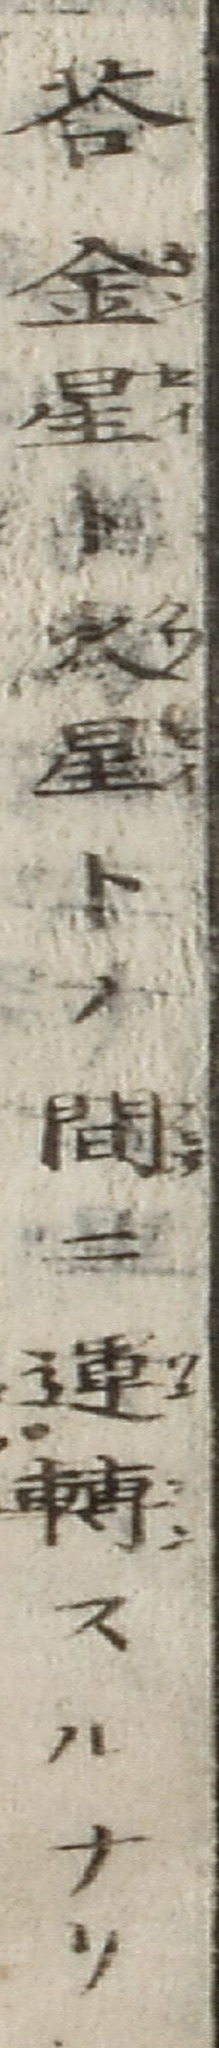答金星ト火星トノ間ニ運転スルナリ
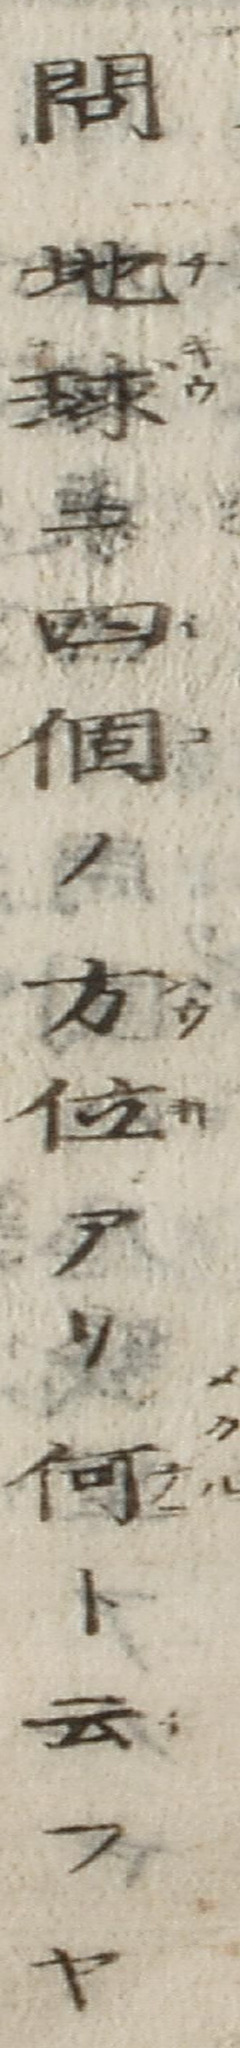問地球ニ四個ノ方位アリ何ト云フヤ
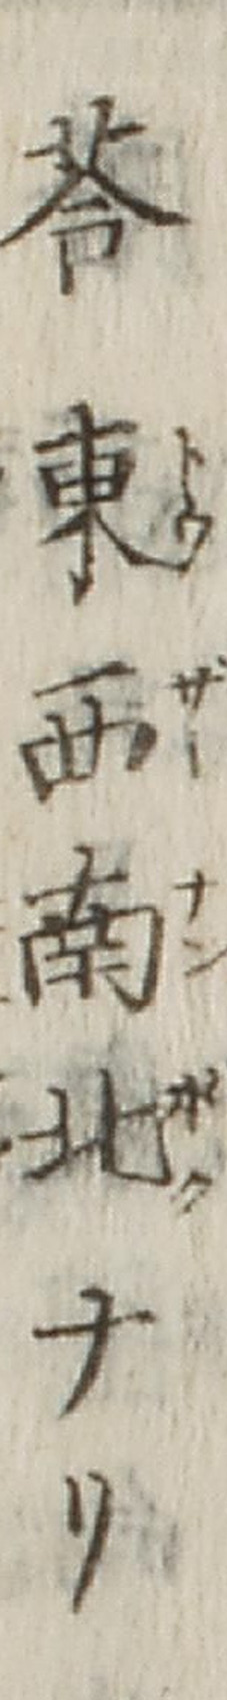答東西南北ナリ
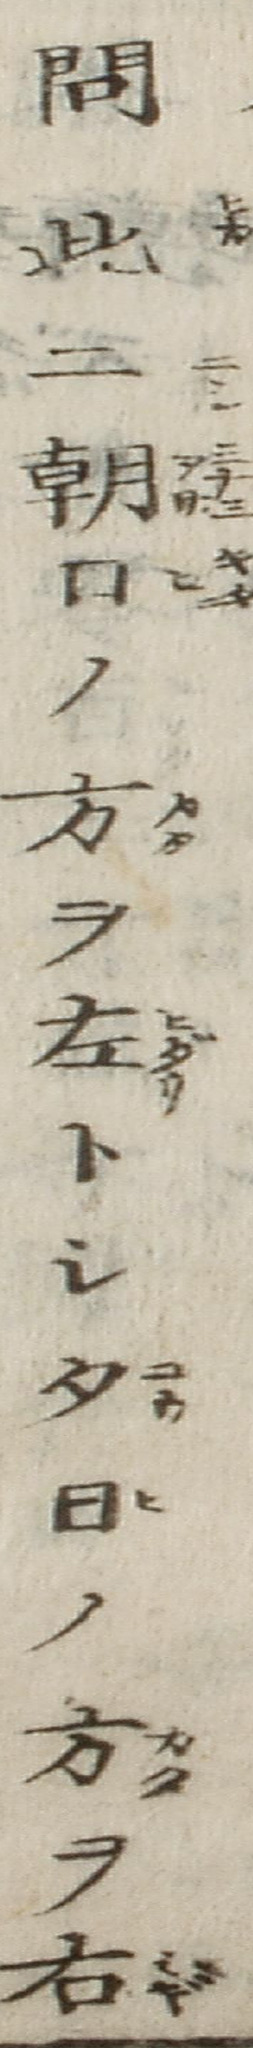問此ニ朝口ノ方ヲ左トシ夕日ノ方ヲ右
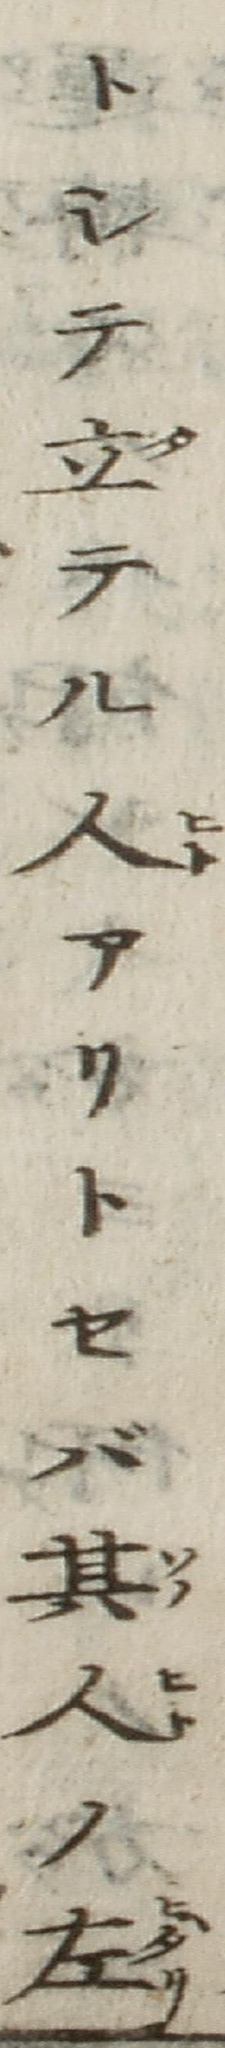トシテ立テル人アリトセバ其人ノ左
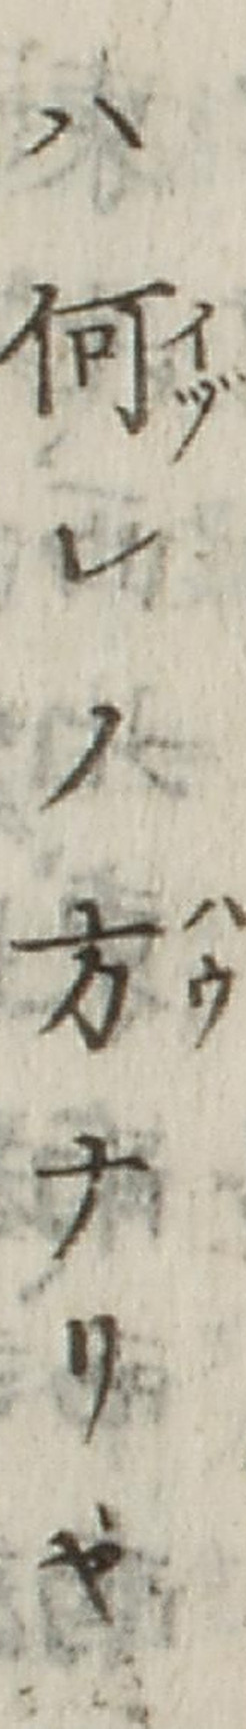ハ何レノ方ナリヤ
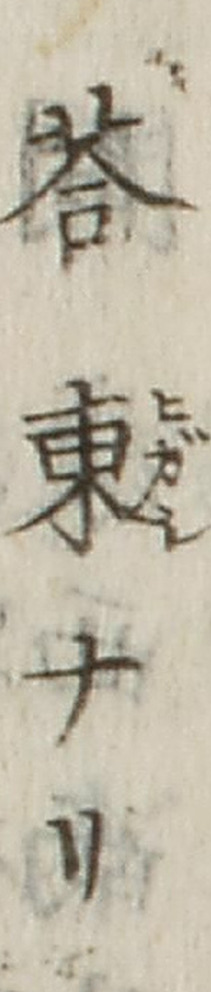答東ナリ
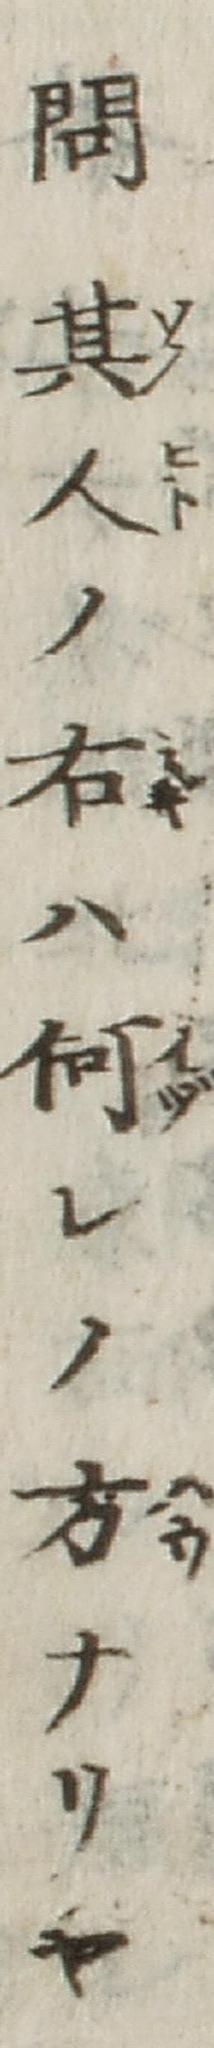問其人ノ右ハ何レノ方ナリヤ
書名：地球儀問答　全
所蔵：東京大学地震研究所図書室 Earthquake Research Institute Library, The University of Tokyo, JAPAN
